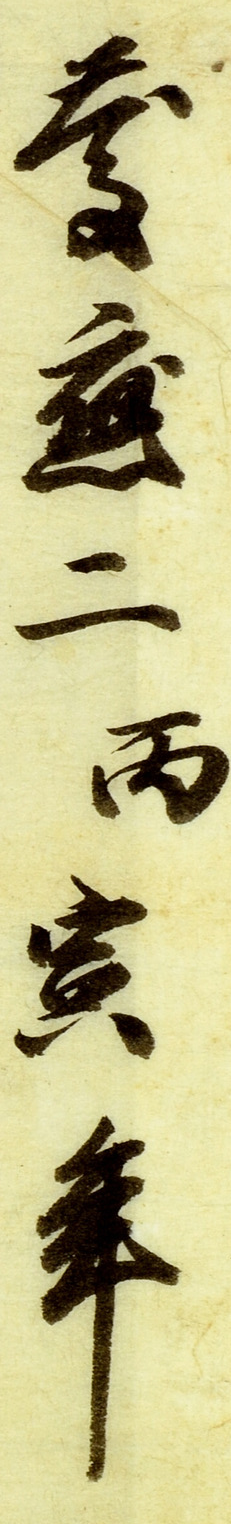慶應二丙寅年

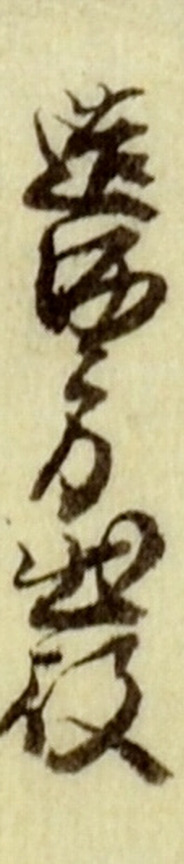造酒方出役
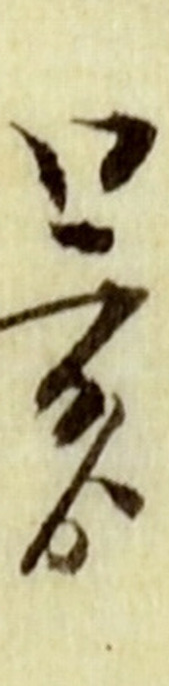同二日ゟ
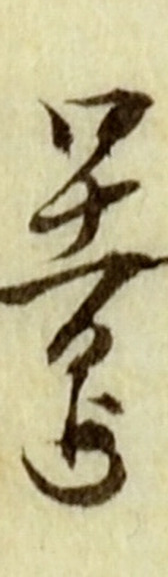同十二日ゟ
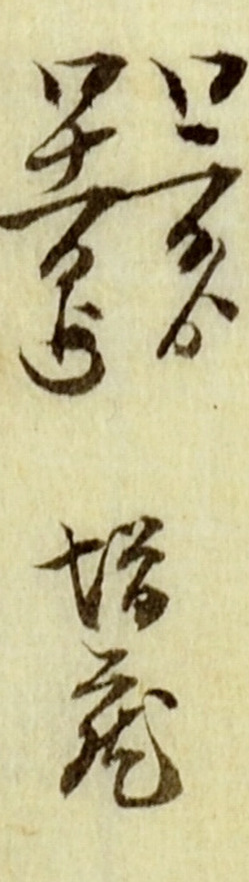同十一日ゟ増蔵
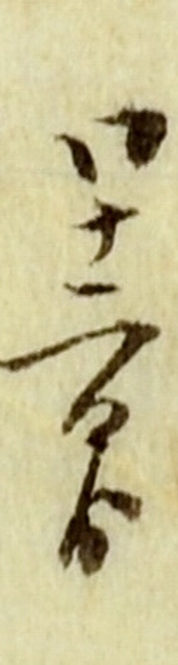同十二日ゟ

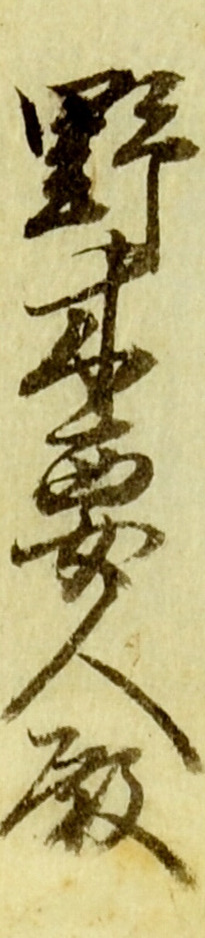野木要人殿
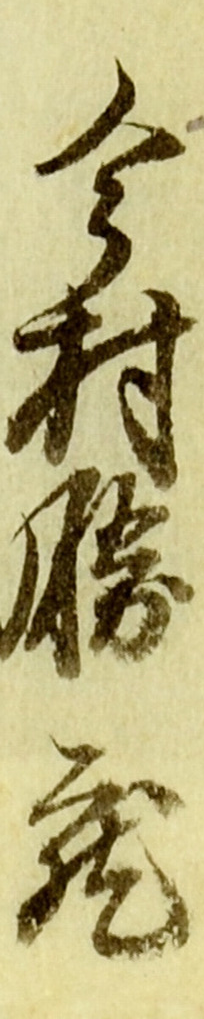今村勝蔵
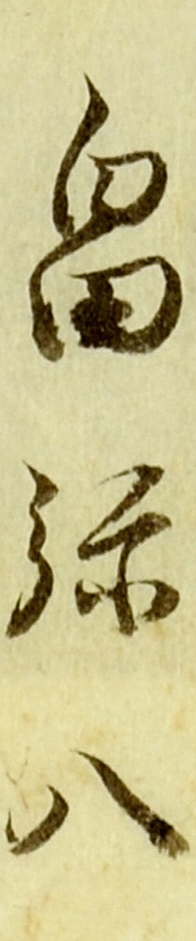畠弥八
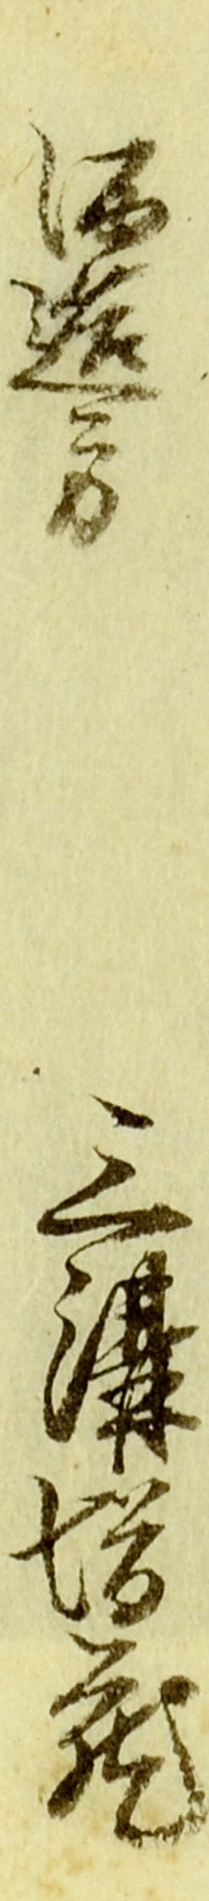酒造方三溝増蔵
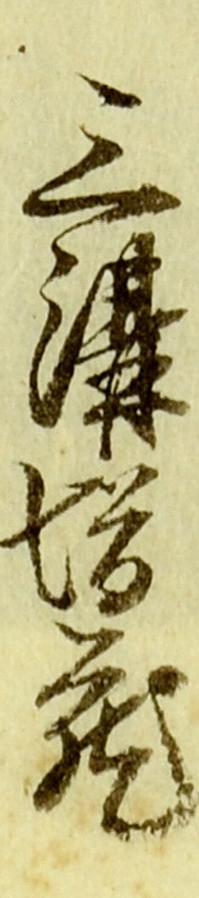三溝増蔵
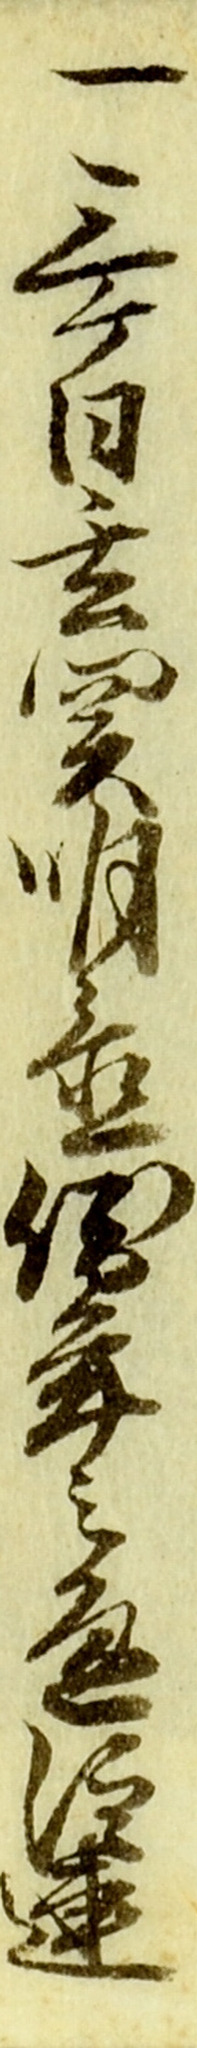一三ケ日玄関明置例年之通注連
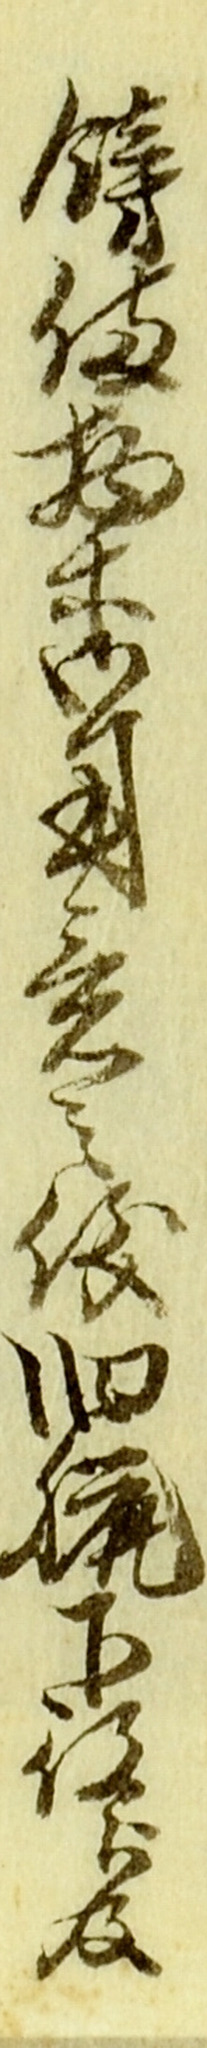錺備物等御用意之儀旧臘下役江及
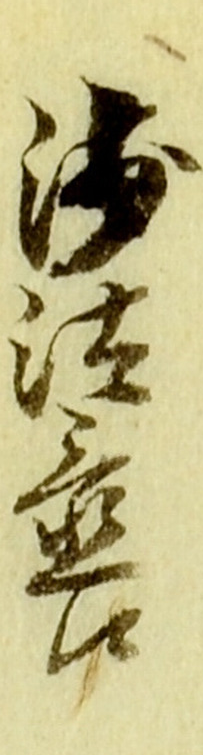沙汰置候
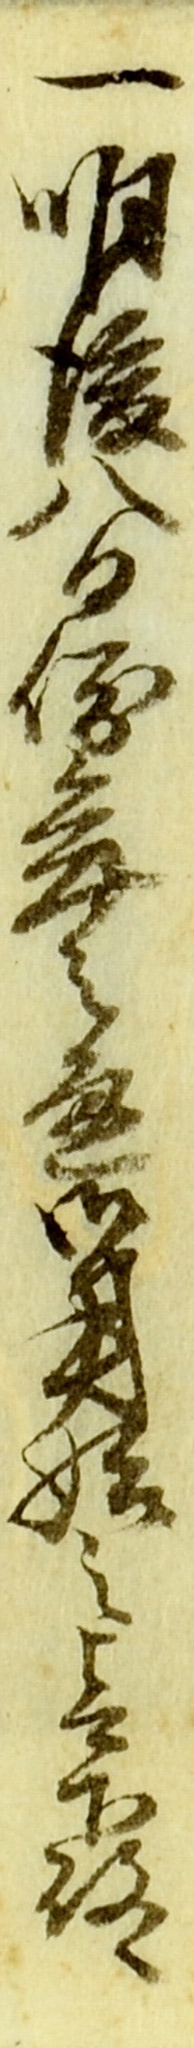一明後八日例年之通御用始之旨下役へ
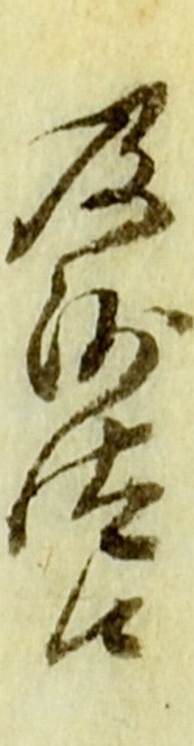及沙汰候
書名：諸事御用留
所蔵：伊那市立高遠町図書館・合同会社AMANE
